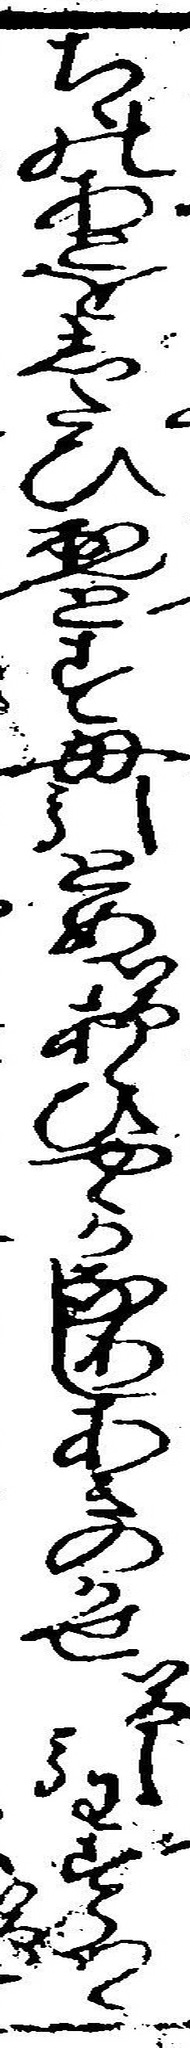ちゝのあとをしたひ出んとす母引とめいろあゝひやゝかなりしあきのかせいろ引わすらはゝ
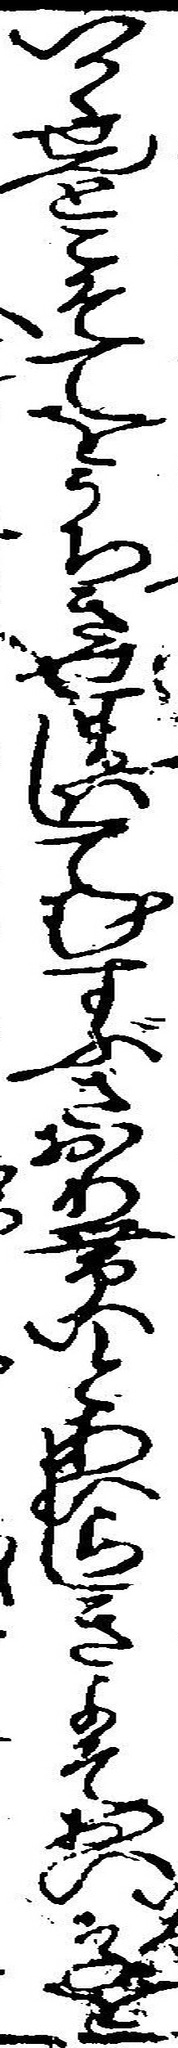いかゝせんとこそてをうちきせまはしてむすぶさおり帯いとあいらしきよそおいいろ子を
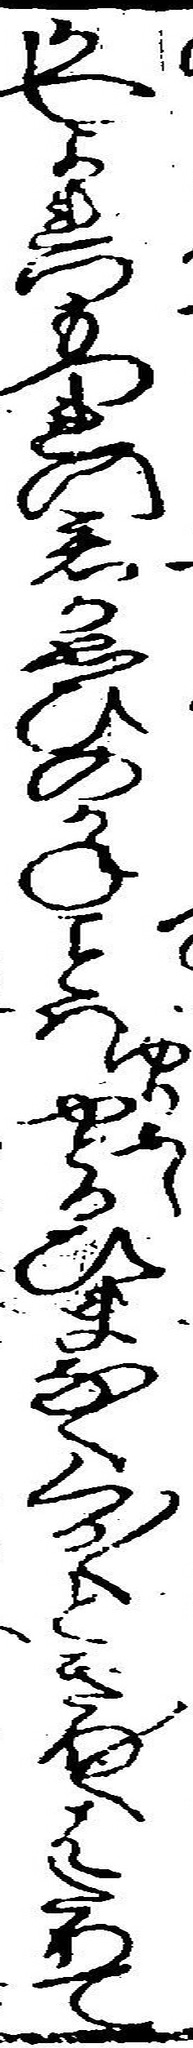かへしよれつもつれつ君か思ひのかねことはゆりふしやとるひまなくくる〳〵ときり〳〵はたりて
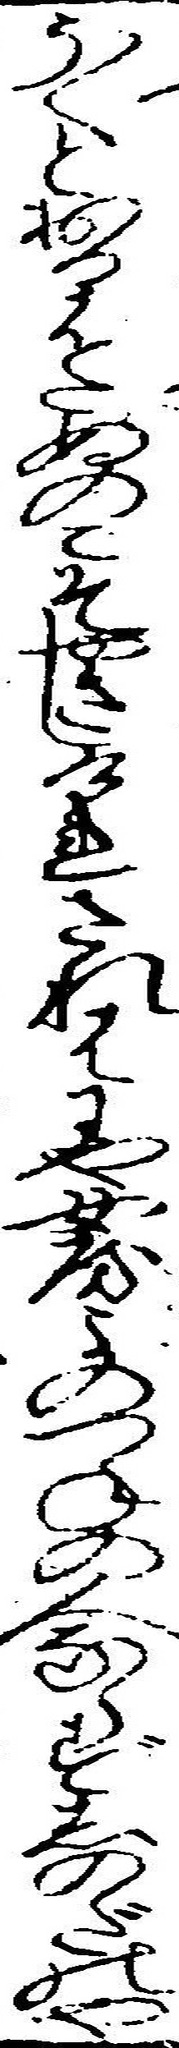う〳〵とおるはたぬのこそやさしけれされはにや女房よのつねの人ならずしのだのや
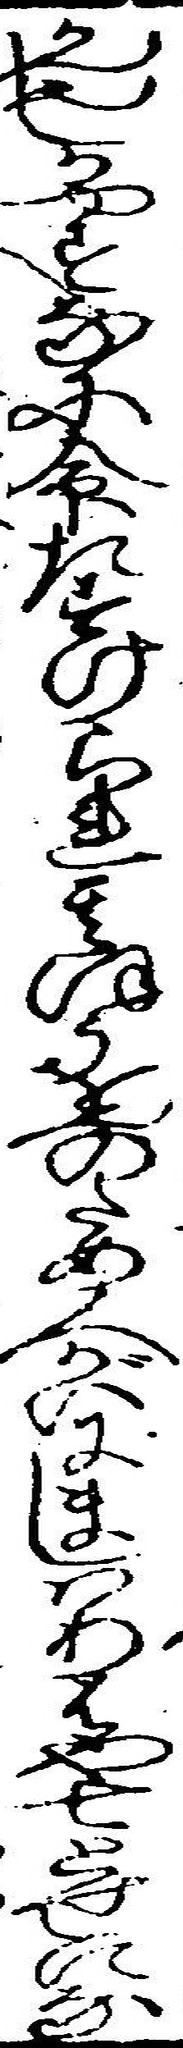かん也しかやすなに命たすけられ其ほうをんのため人がいにましはりはや七とせにな
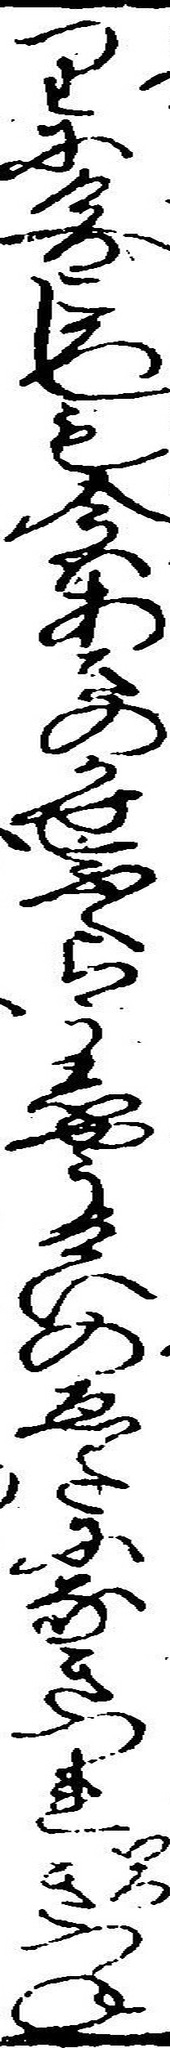りにけるころしも今はあきのかせふくらうしやうけいのゑたになきつれいろきつね
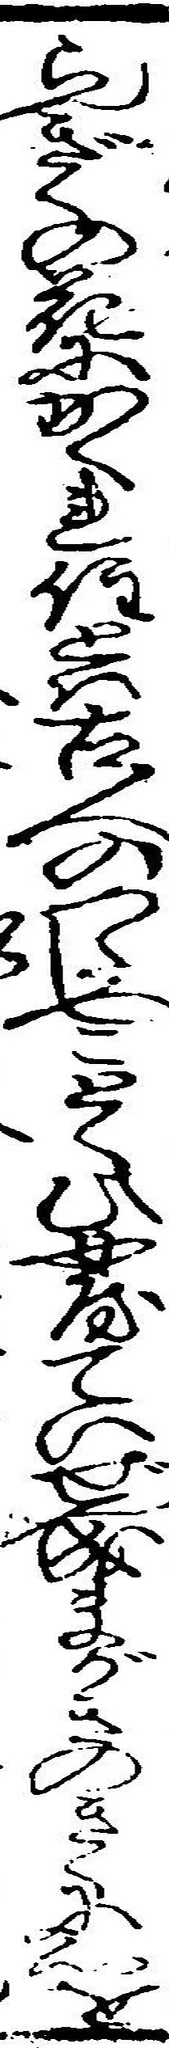らんぎくの花にかくれ住とは古人のつたへしことく此女房ていぜん成まがきのきくに心を
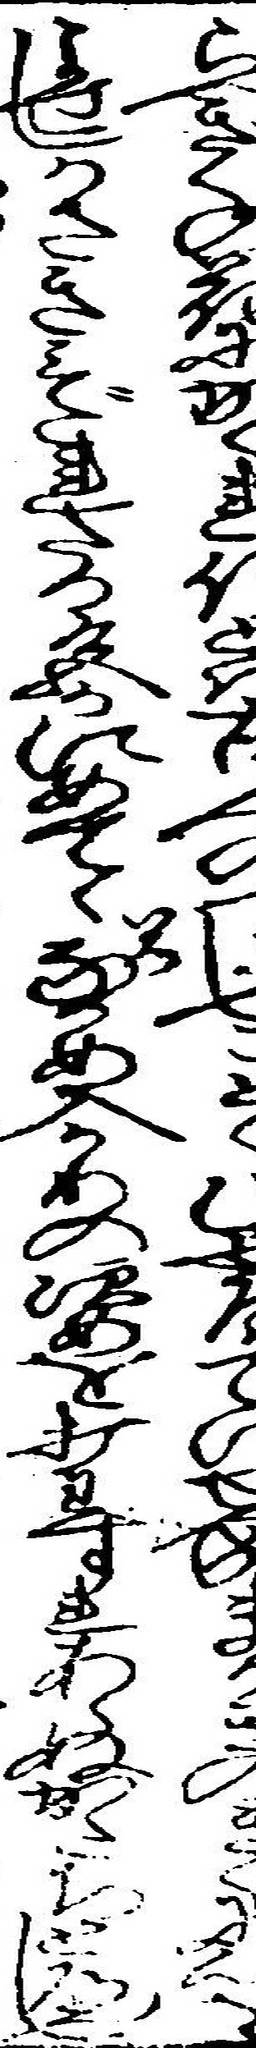よせしかさきみだれたる色かにめてゝいろなかめ入うわの姿を打わすれあらぬかたちとへんし
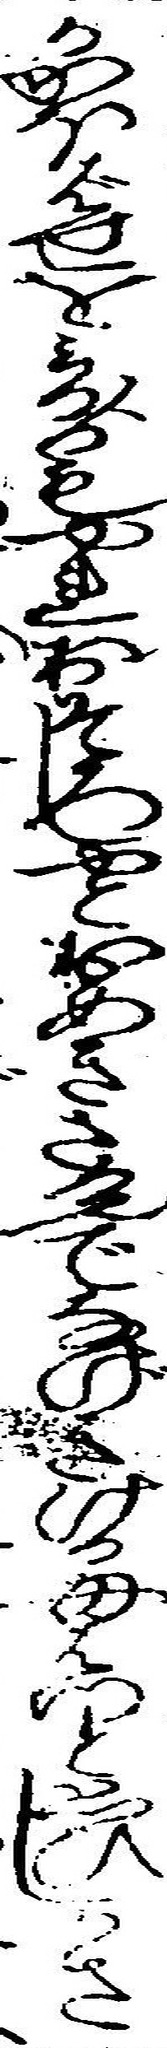かかほばせをみるゟもやれおそろしやとおめきさけんでなげきける母はつと思ひしかさ
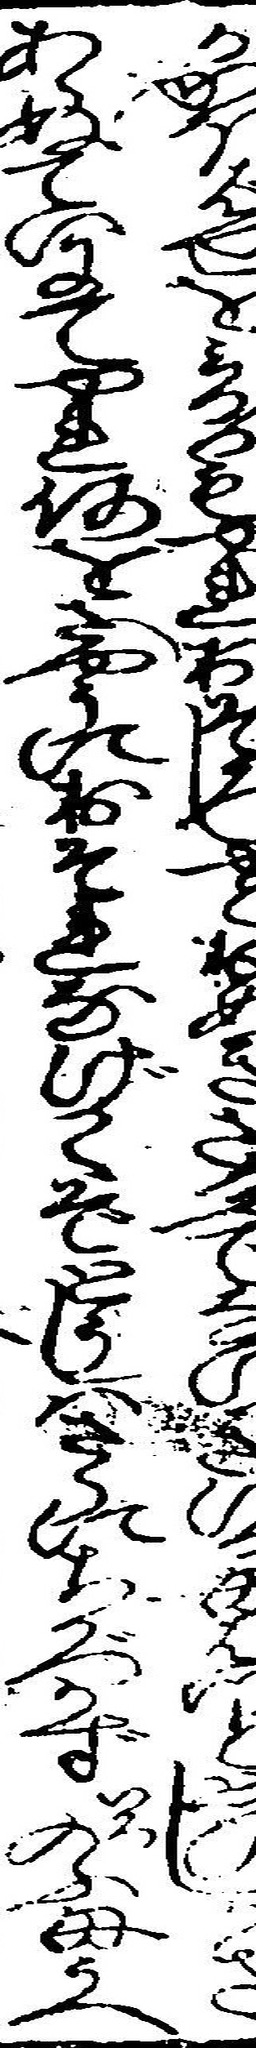あらぬていにてやれ何をさやうにおそれなげくぞとうしはさらにちかづかずいろのふ母うへ
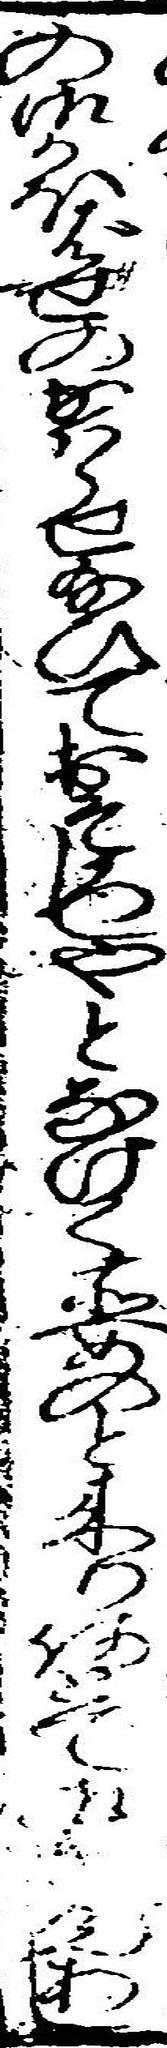の御かほばせのかはらせ給ひておそろしやとなけく所へめのと来り何とて御けんあし
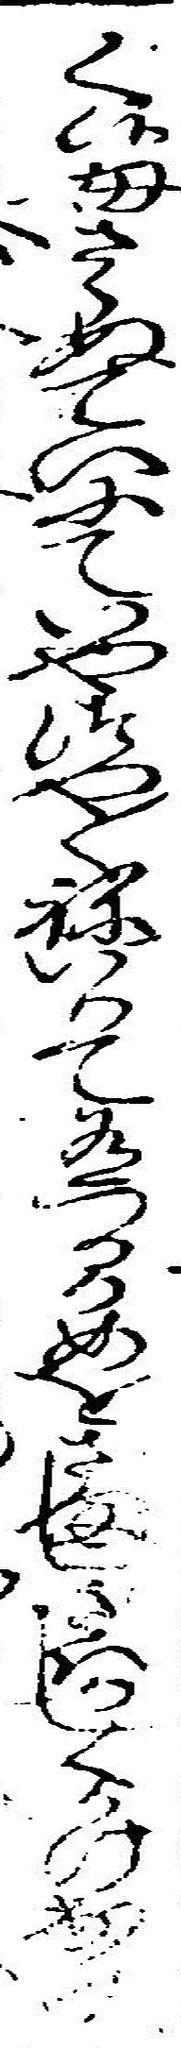く候母さらぬていにていやつや〳〵ねいりて有つるかめをさましさはかしくかけ出
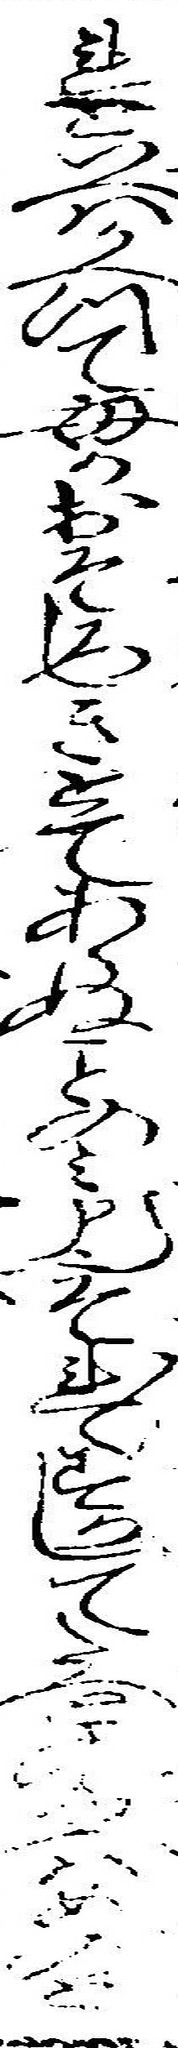れといへはかへつて母かおそろしきとてあらぬことのみ申也それ〳〵すかしてたへとへはめのと
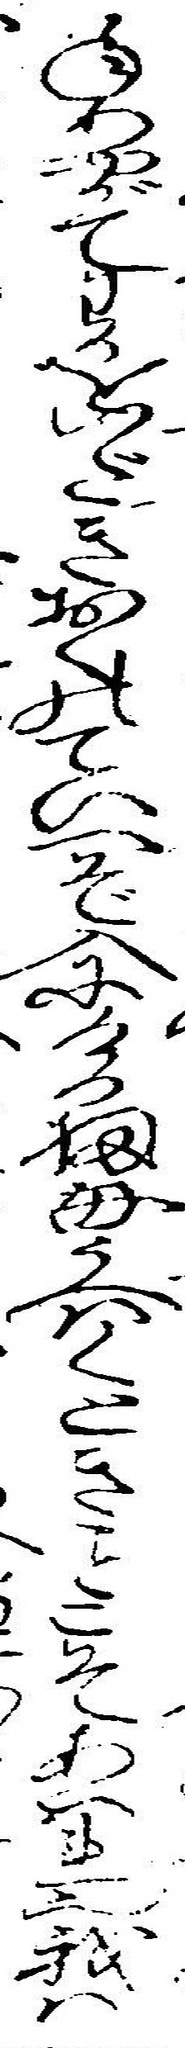承りやがてわかをいだきおくのていへぞ入にける扨母うへはくときことこそあはれ也我は
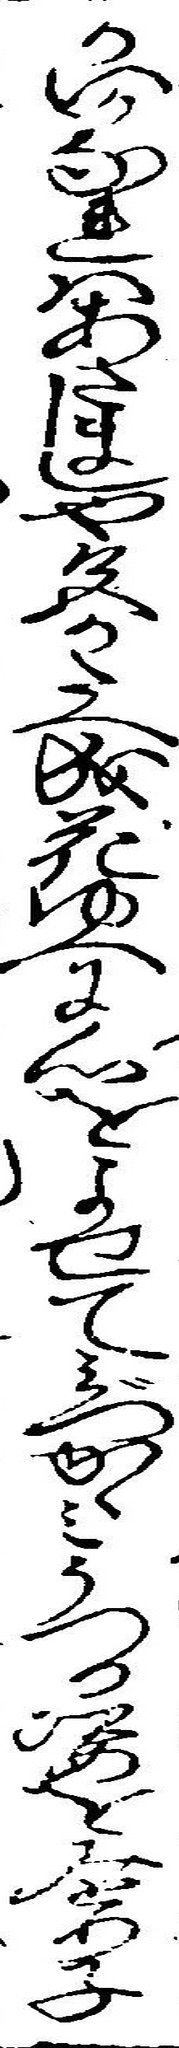かいかなれはあさましや色かたへ成花ゆへに心をよせてみづかゝみうつる姿をみとり子
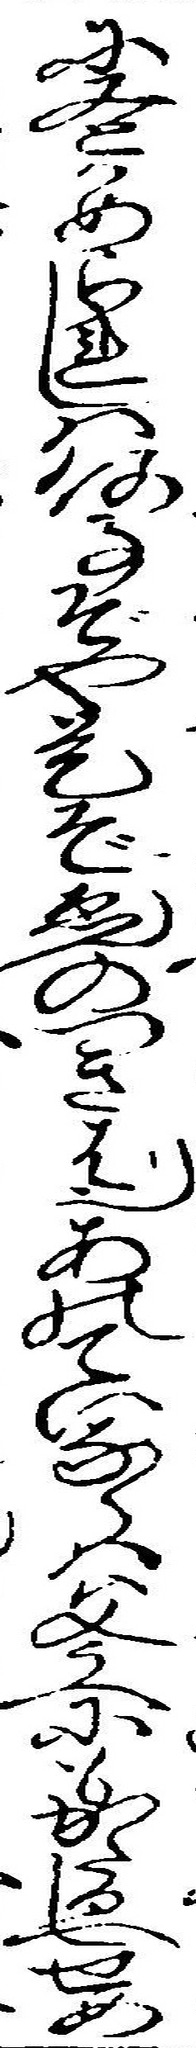にみとかめられしは何事ぞや是ぞゑんのつきは也あのていならは父うへにもかたるへしせめ
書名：[しのだづまつりぎつね付あべの清明出生]
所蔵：東京大学総合図書館 General Library in the University of Tokyo, JAPAN
